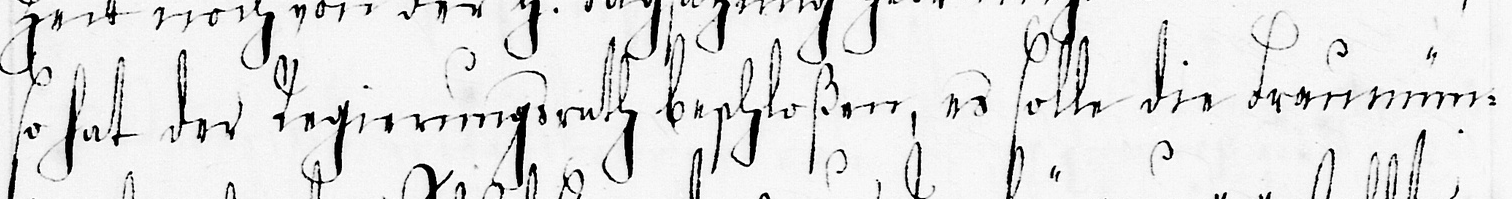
so hat der Regierungsrath beschloßen, es solle die Fraumün¬
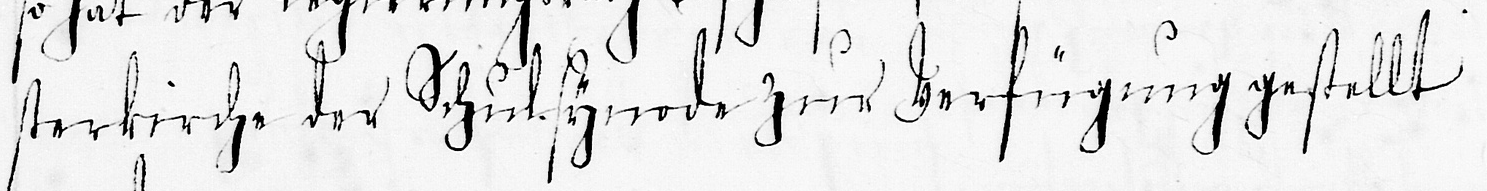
sterkirche der Schulsynode zur Verfügung gestellt
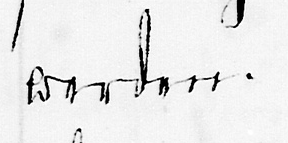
werden.
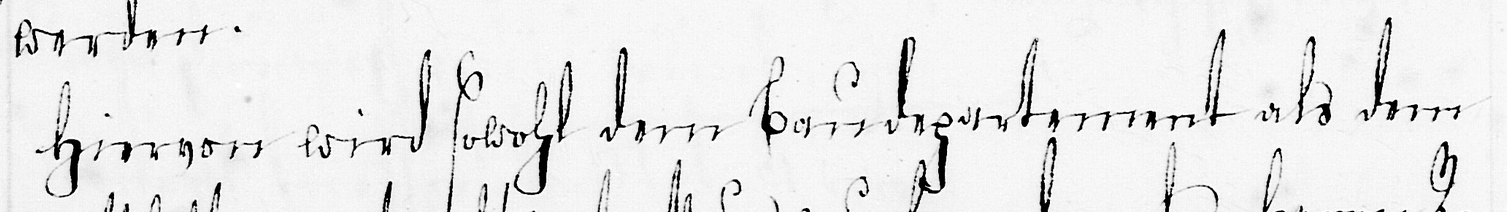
Hiervon wird sowohl dem Baudepartement als dem
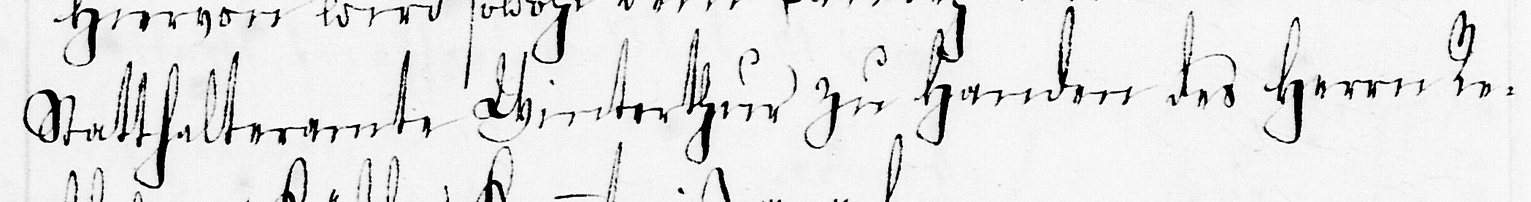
Statthalteramte Winterthur zu Handen des Herrn Re¬
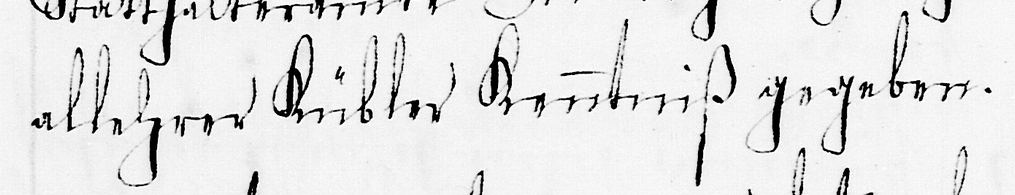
allehrer Kübler Kenntniß gegeben.
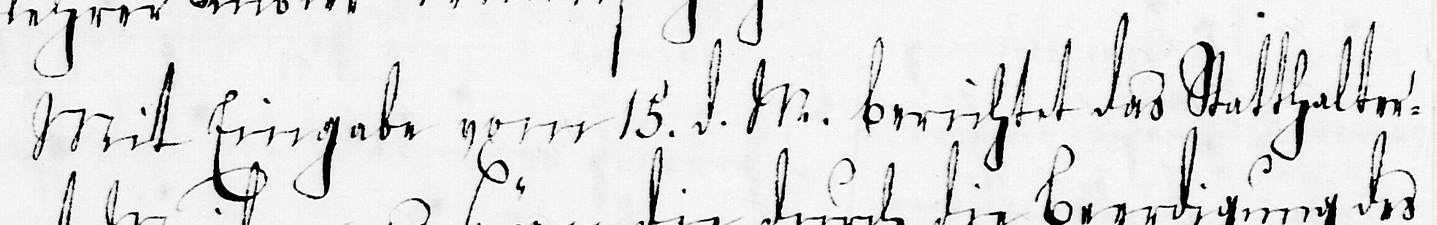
Mit Eingabe vom 15. d. M. berichtet das Statthalte¬
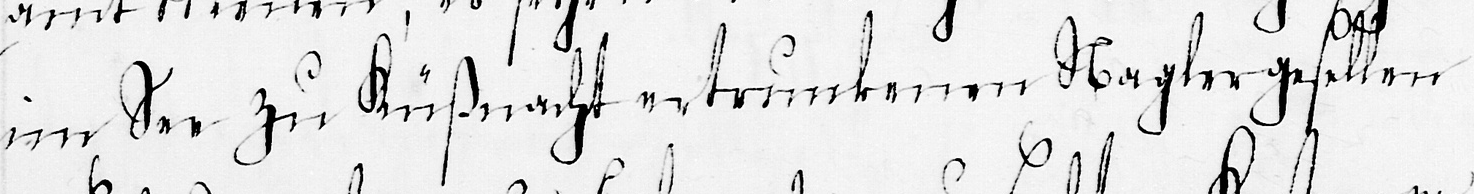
im See zu Küßnacht ertrunkenen Naglergesellen
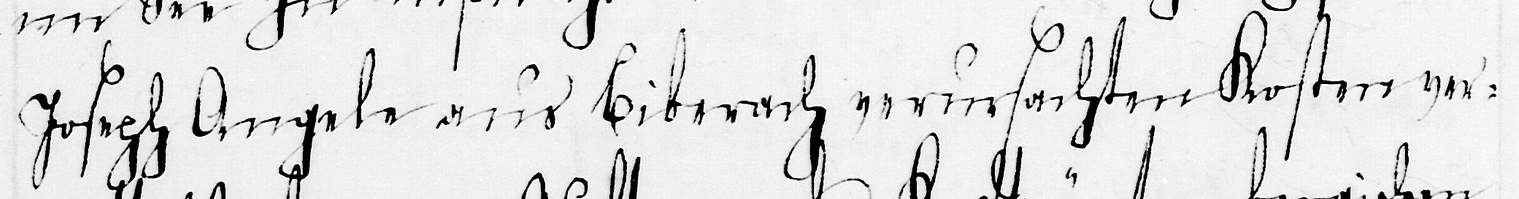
Joseph Angele aus Biberach verursachten Kosten ver¬
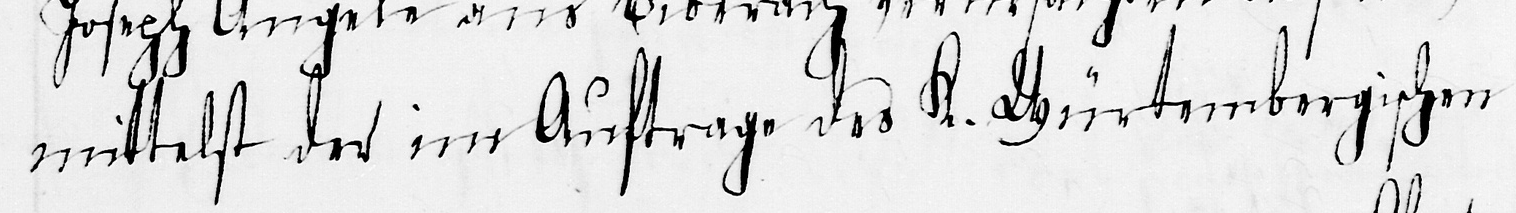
mittelst der im Auftrage des K. Würtembergischen
